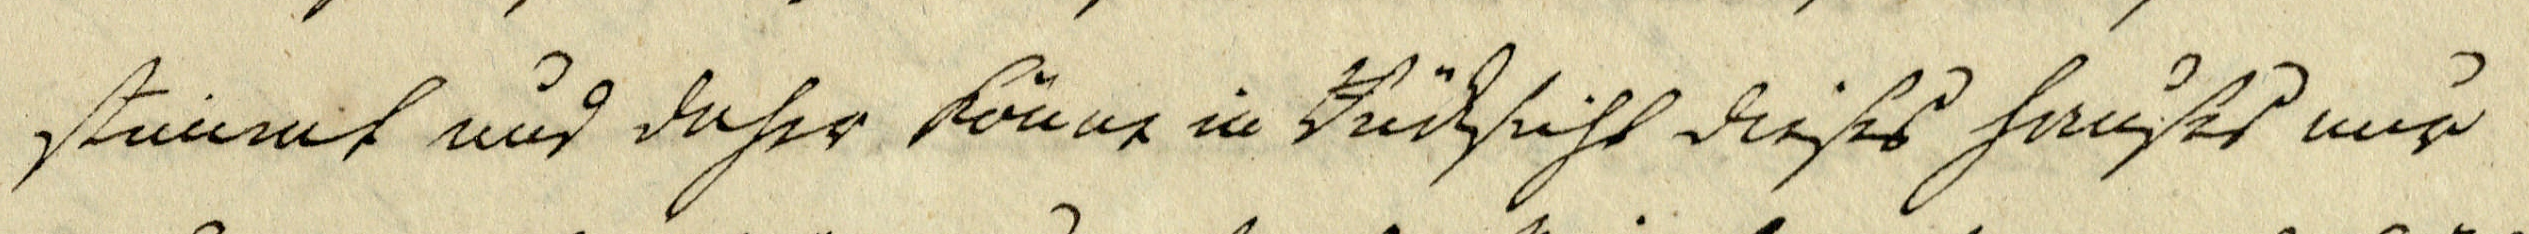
stimmt und daher könne in Rücksicht dieses Hauses nur
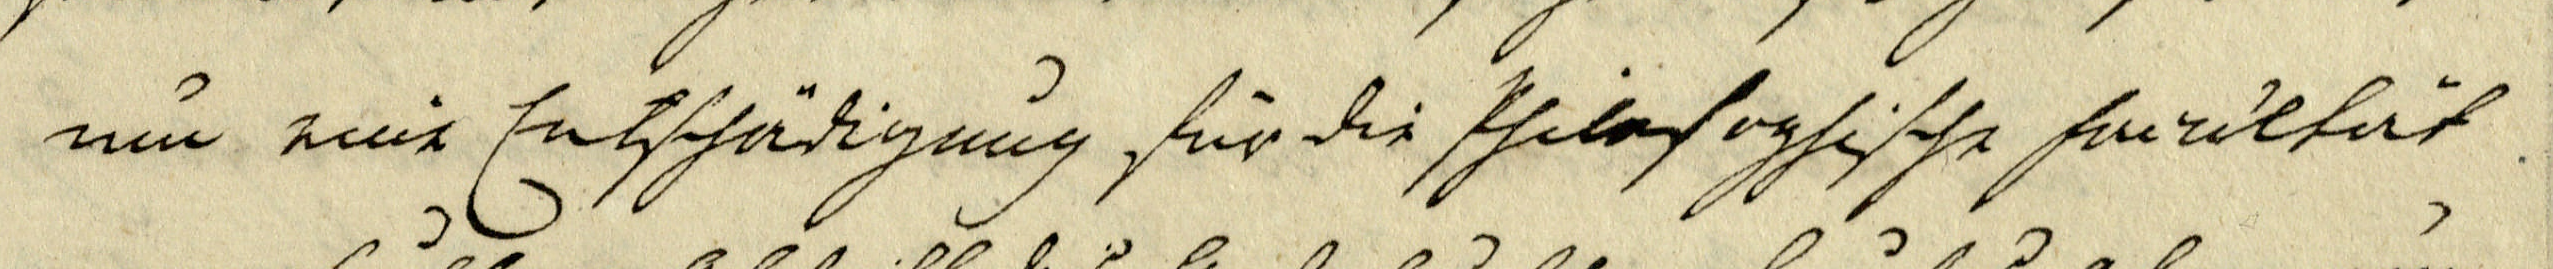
um eine Entschädigung für die Philosophische Facultät
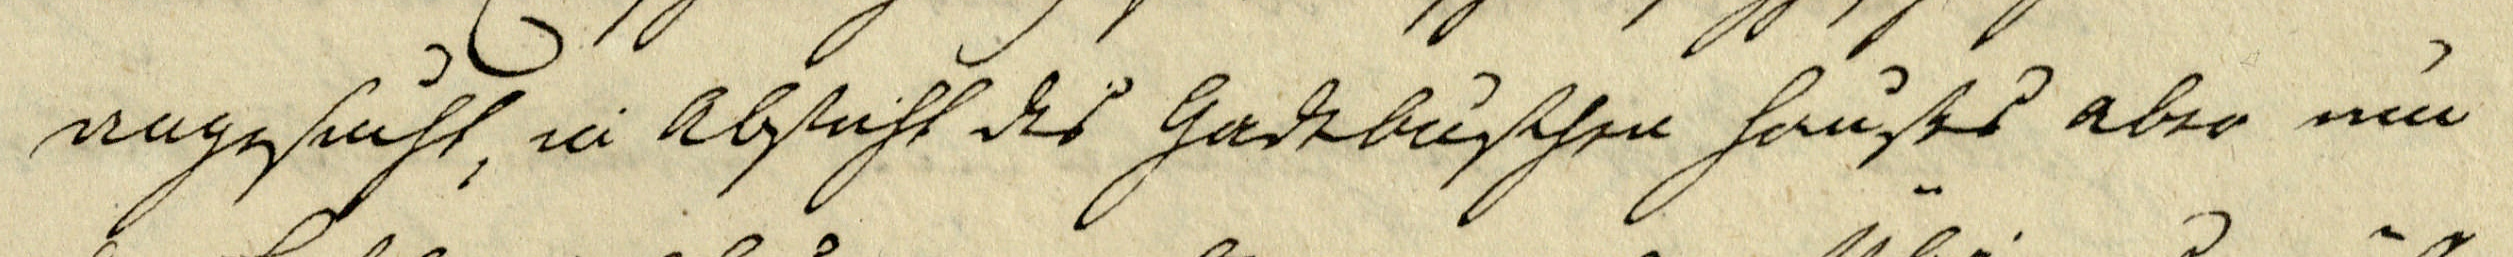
angesucht, in Absicht des Gadebuschen Hauses aber um
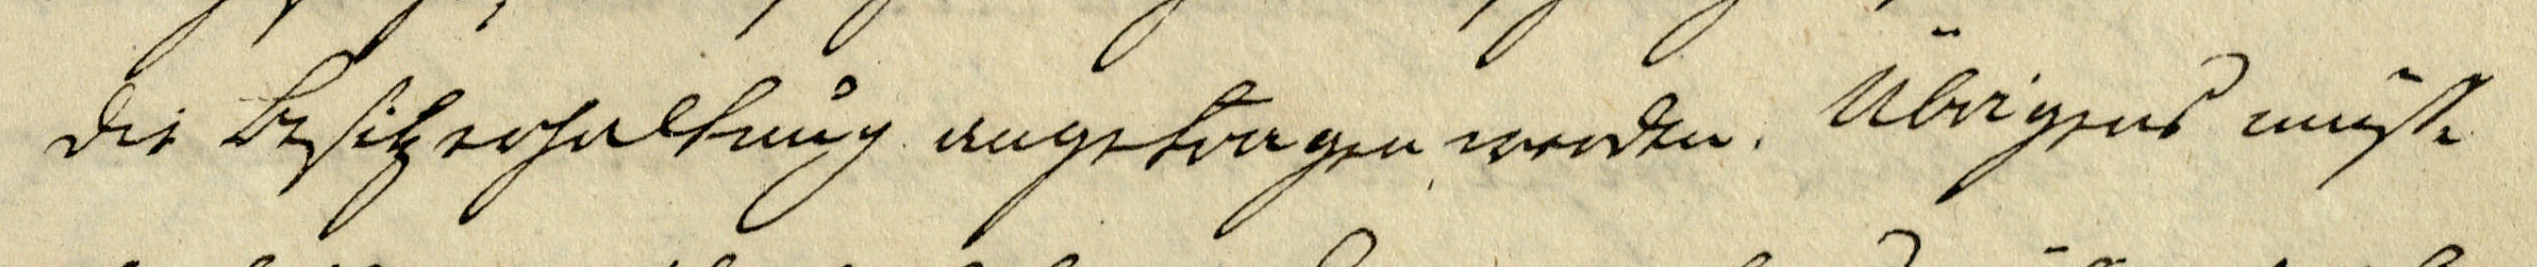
die Besitzerhaltung angetragen werden. Übrigens müsse
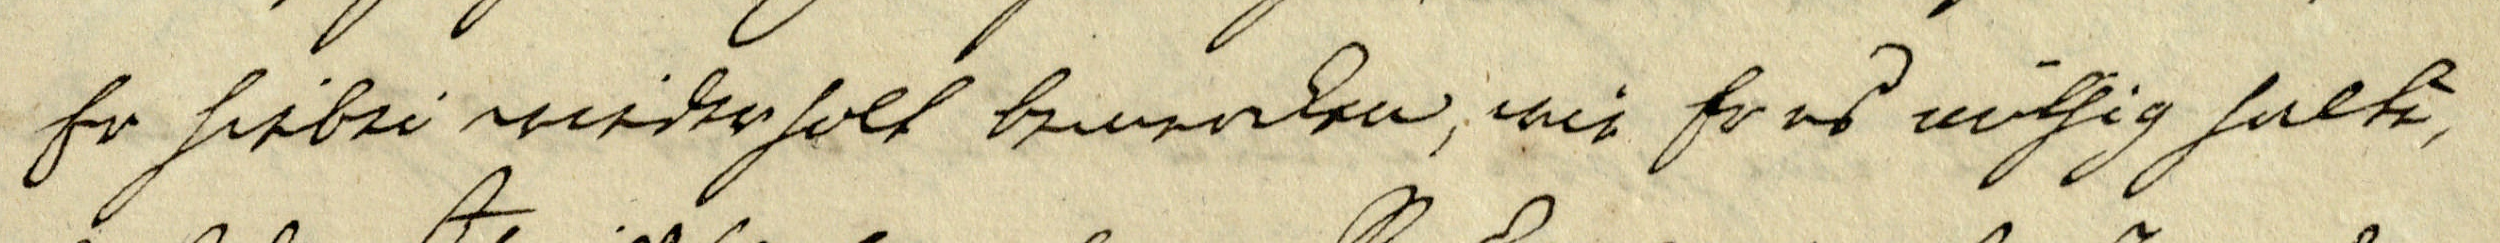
Er hiebei wiederholt bemercken, wie Er es nöthig halte,
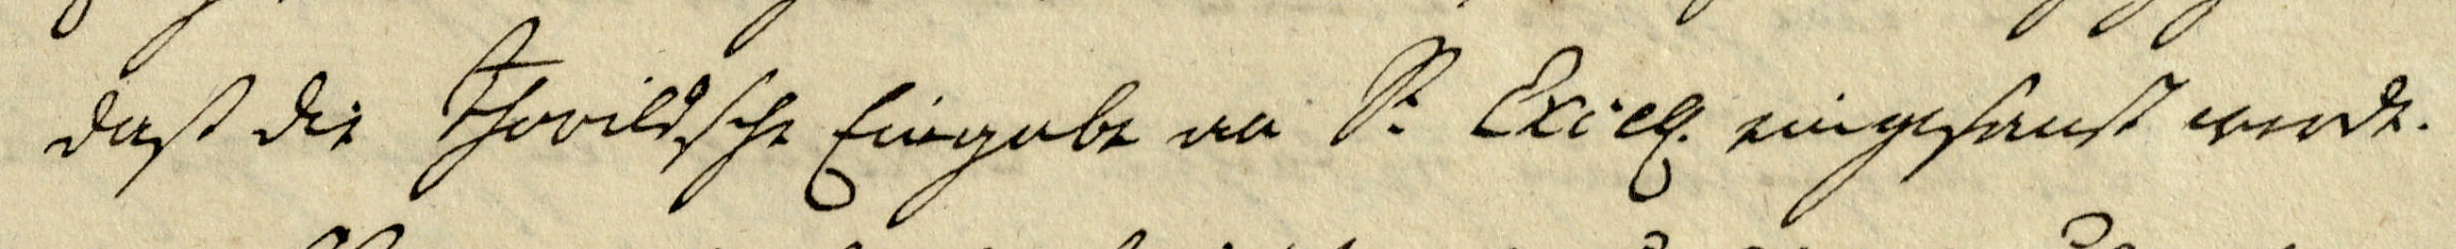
daß die Thorildsche Eingabe an Sr. Excell. eingesandt werde.
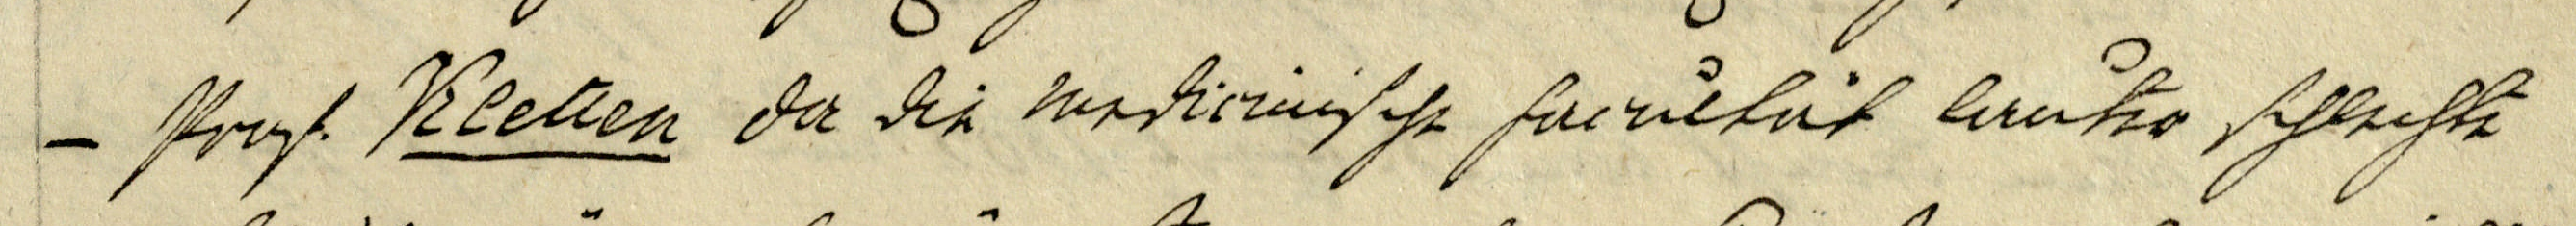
Prof. Kletten da die Medicinische Facultät lauter schlechte
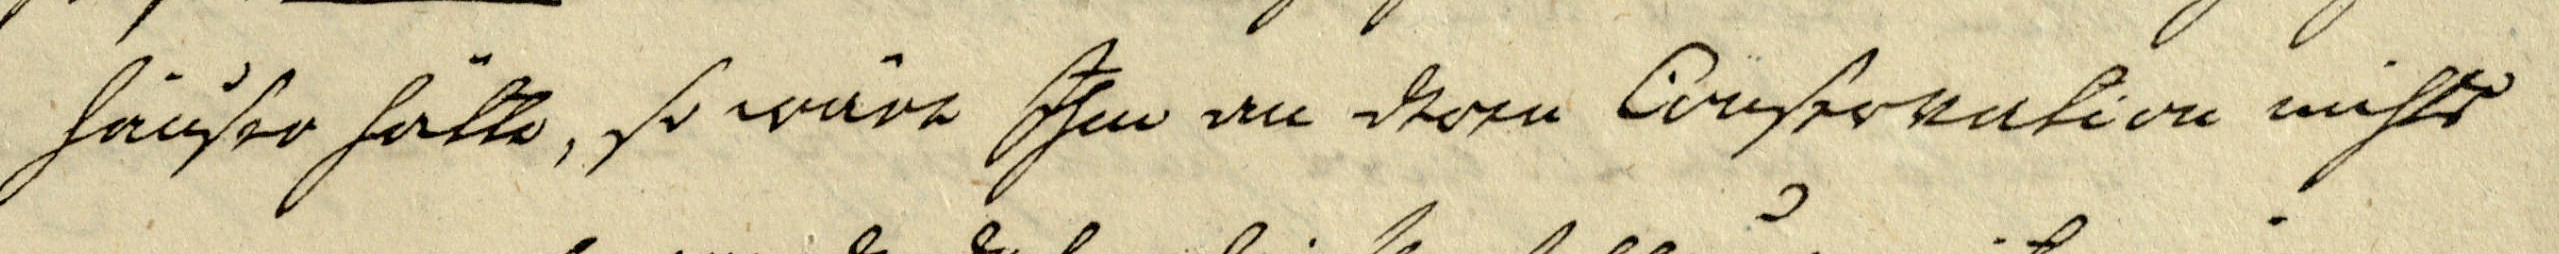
Häuser hätte, so wäre Ihm an deren Conservation nichts
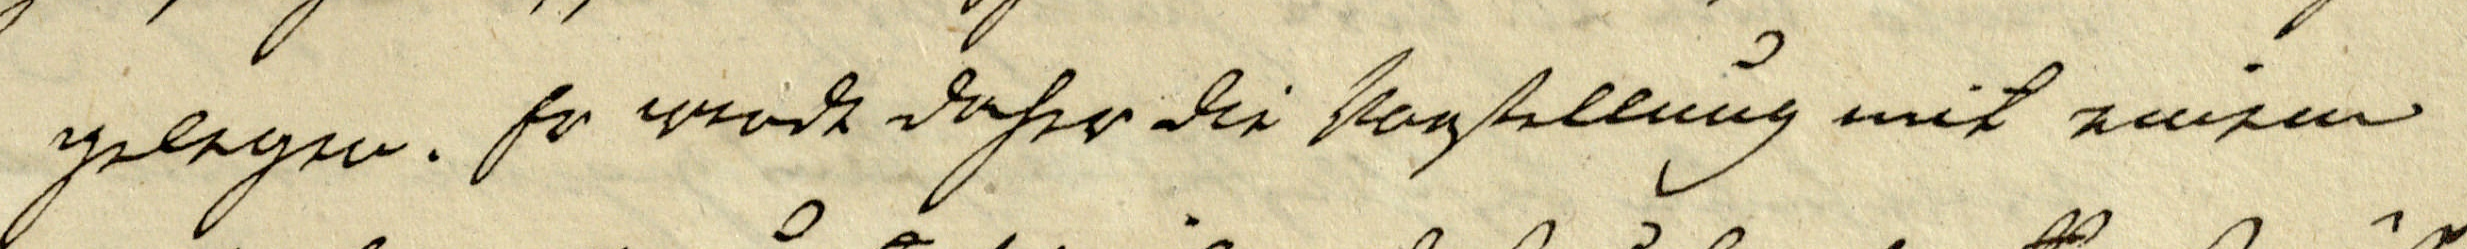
gelegen. Er werde daher die Vorstellung mit einem
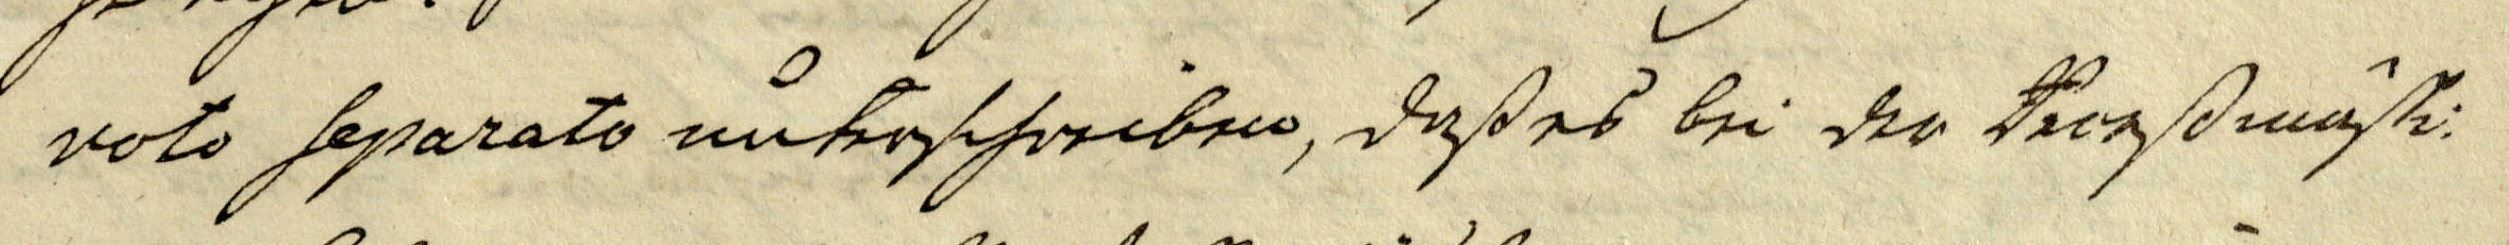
voto separato unterschreiben, daß es bei der Receßmässi¬
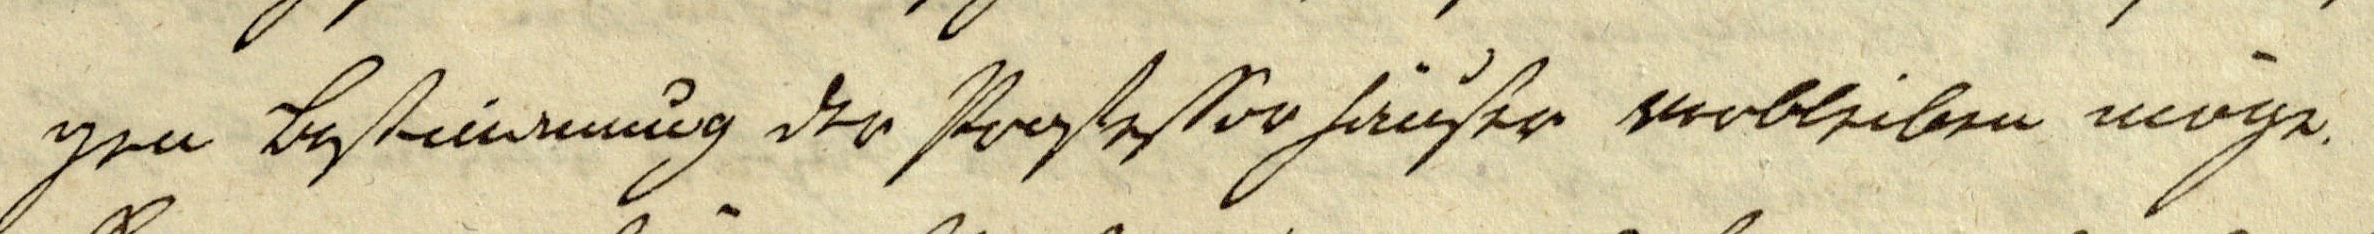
gen Bestimmung der Professor Häuser verbleiben möge.
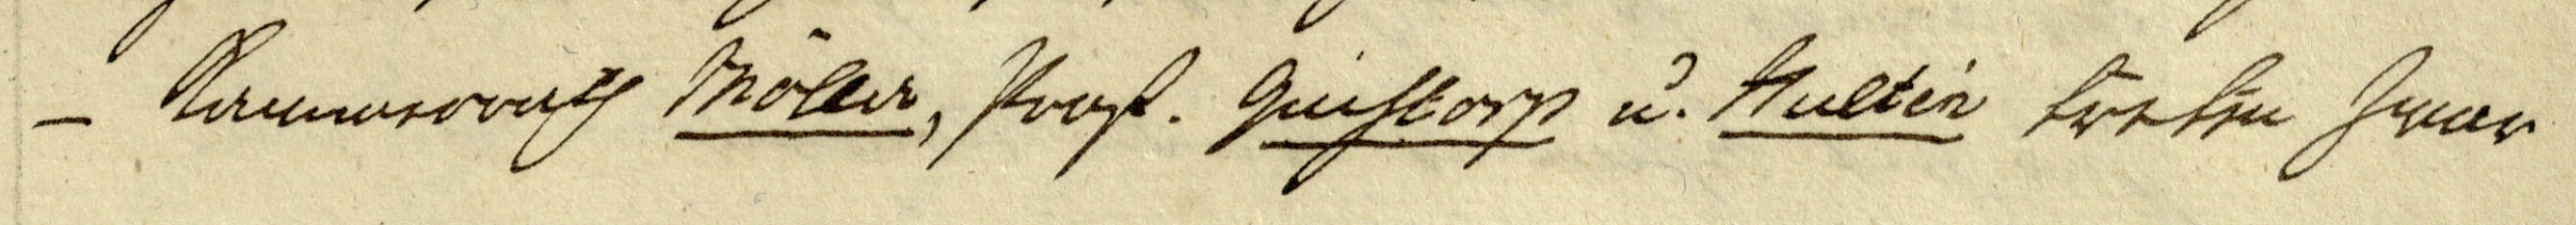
Kammerrath Möller, Prof. Quistorp u. Hultén treten zwar
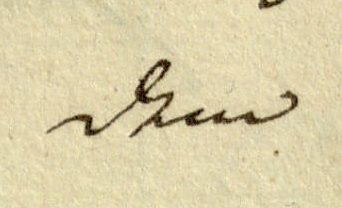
dem
